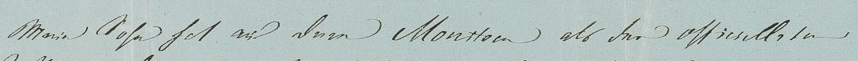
Mein Sohn hat aus dem Moniteur als der officiellsten
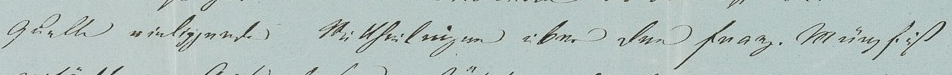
Quelle einliggende Mittheilungen über den franz. Münzfuß
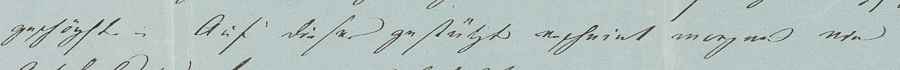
geschöpft. – Auf dieses gestützt erscheint morgen ein
